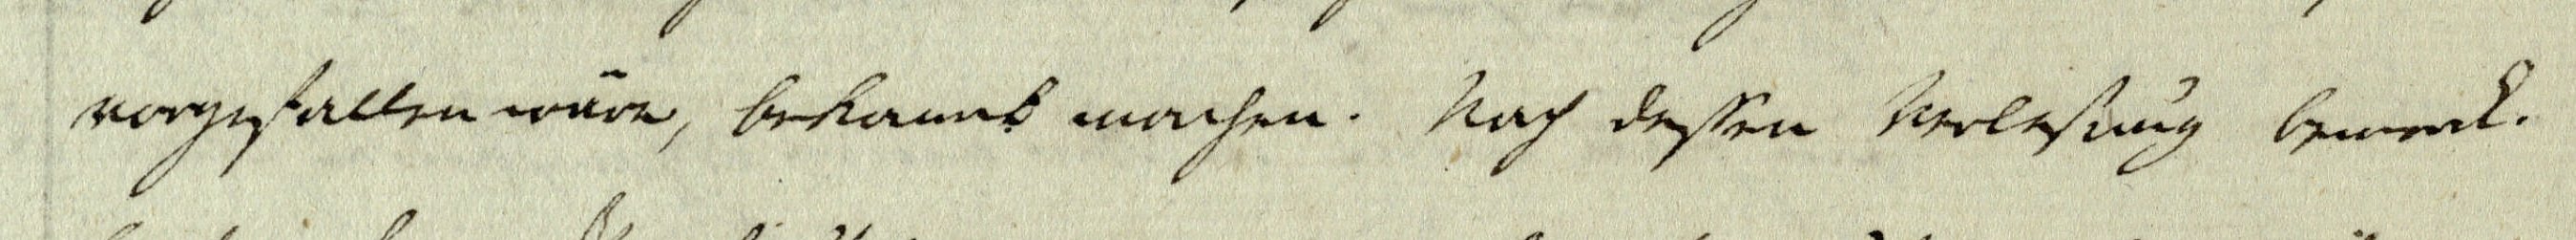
vorgefallen wäre, bekannt machen. Nach dessen Verlesung bemerk¬
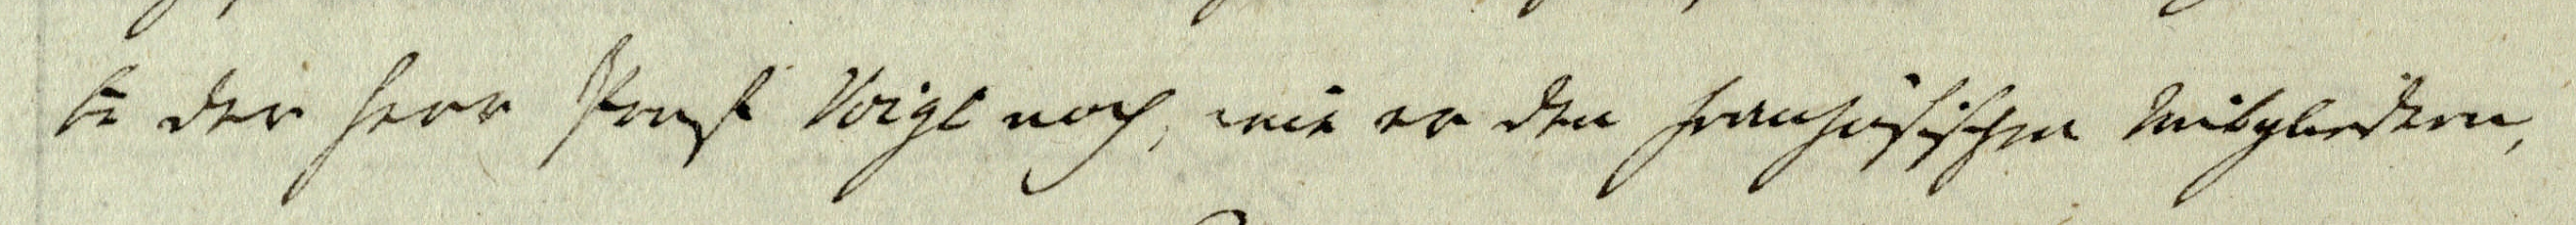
te der Herr Prof. Voigt noch, wie er den französischen Mitgliedern,
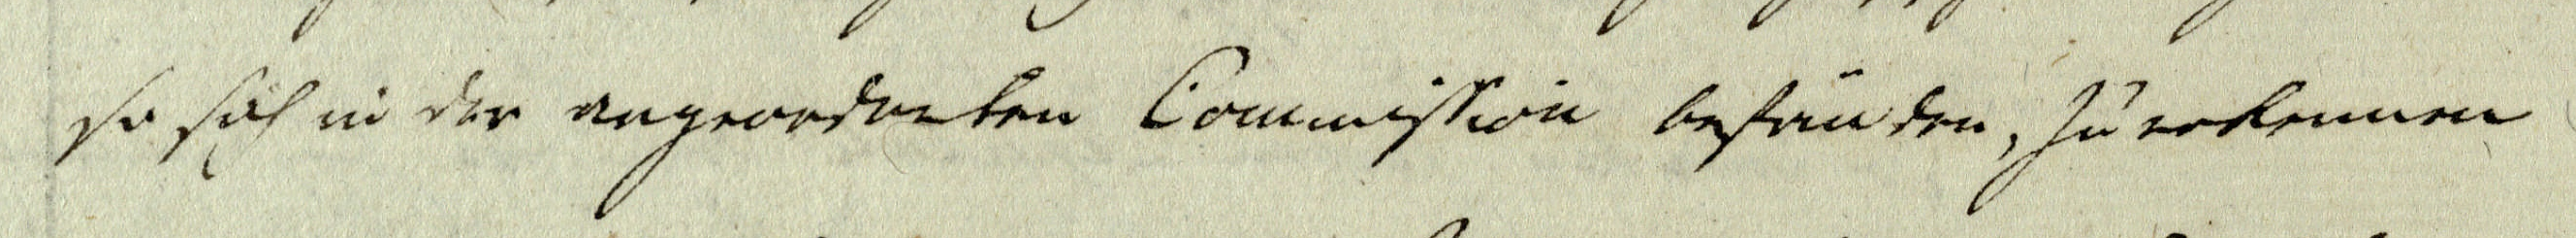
so sich in der angeordneten Commission befänden, zu erkennen
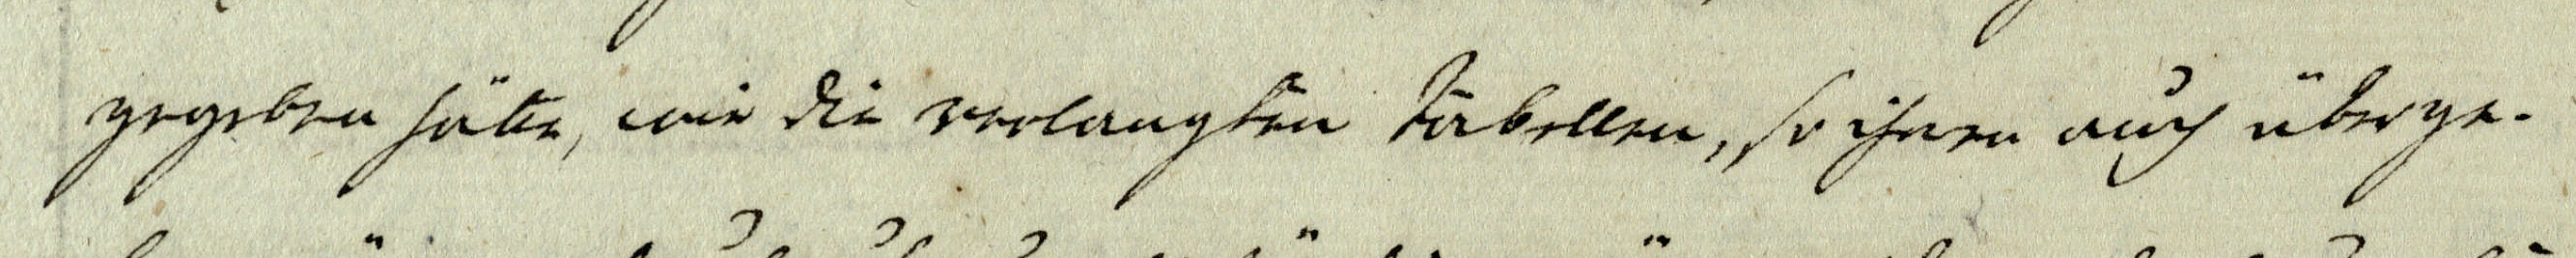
gegeben hätte, wie die verlangten Tabellen, so ihnen auch überge¬
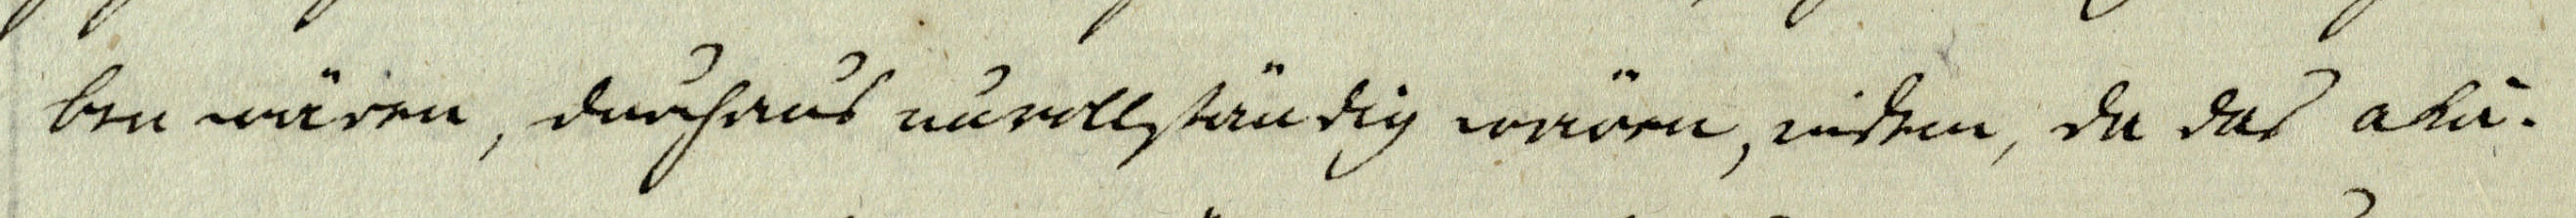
ben wären, durchaus unvollständig wären, indem, da das aka¬
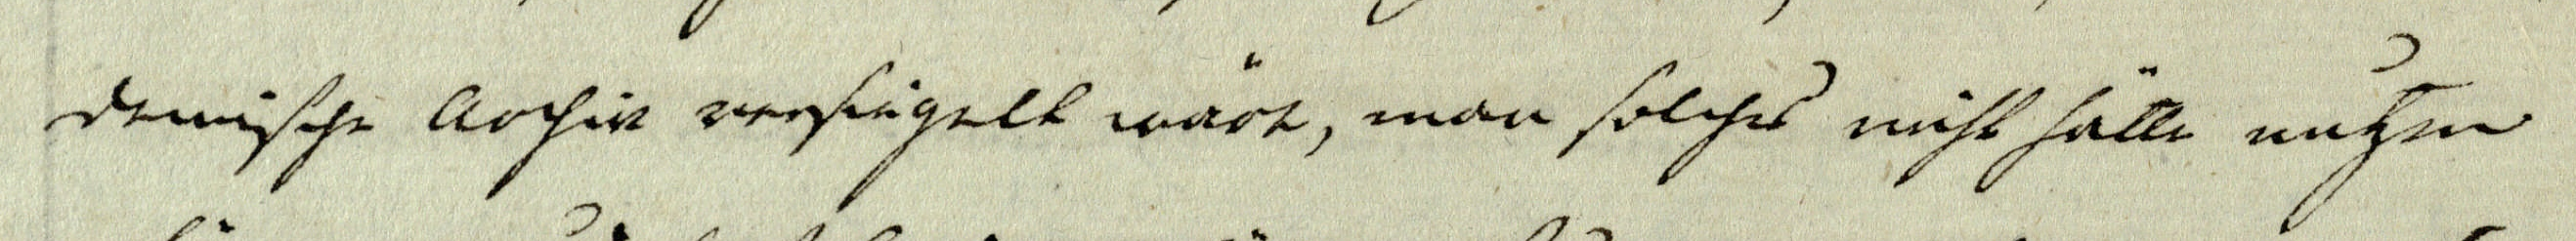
demische Archiv versiegelt wäre, man solches nicht hätte nutzen
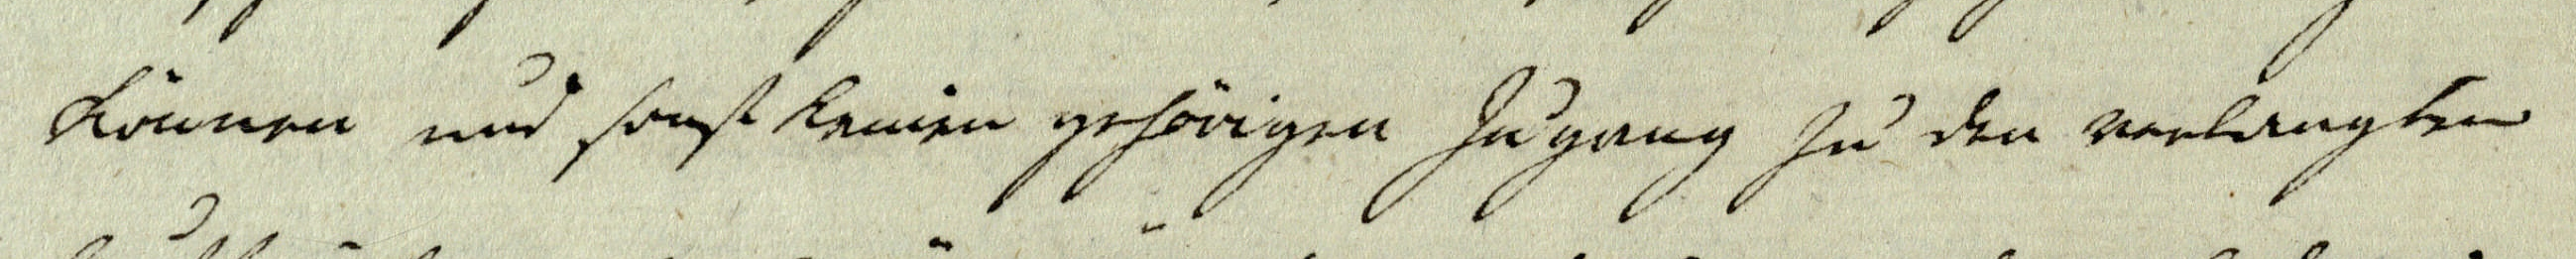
können und sonst keinen gehörigen Zugang zu den verlangten
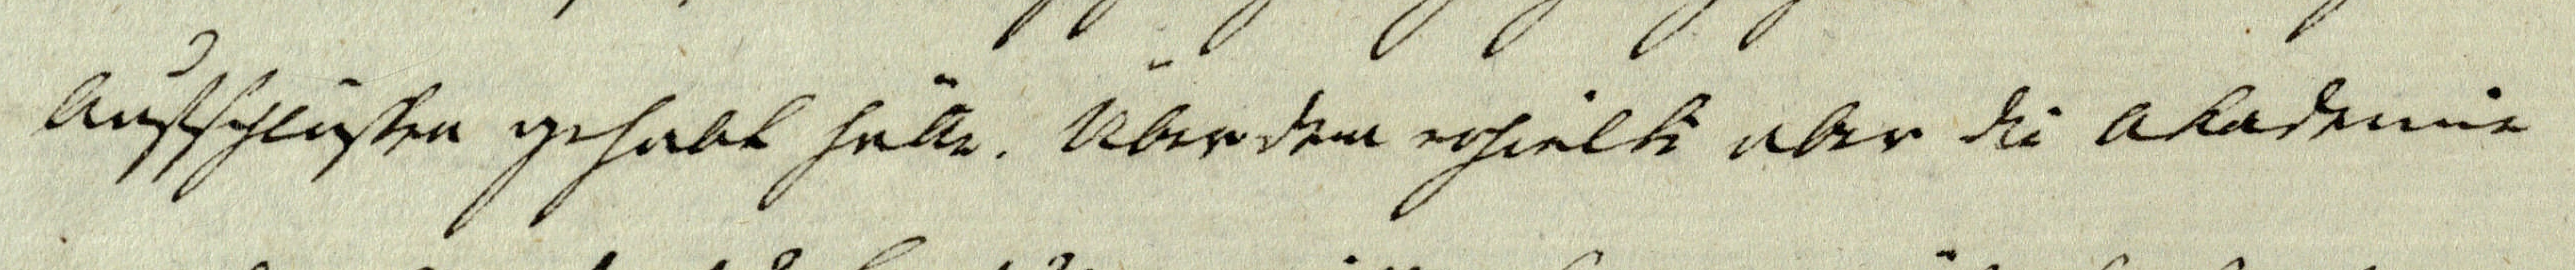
Aufschlüssen gehabt hätte. Überdem erhielte aber die Akademie
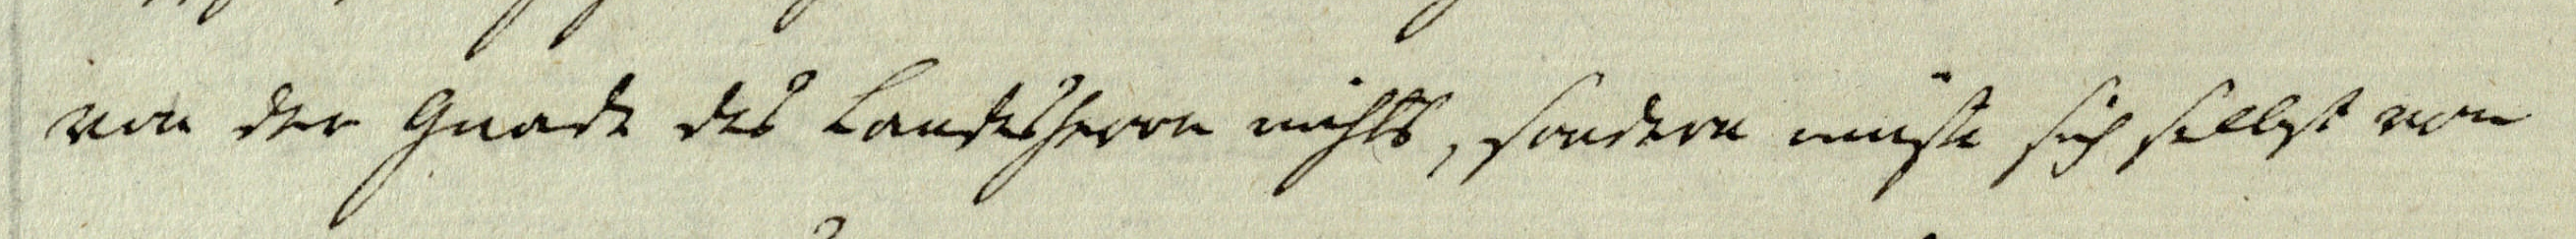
von der Gnade des Landesherrn nichts, sondern müste sich selbst von
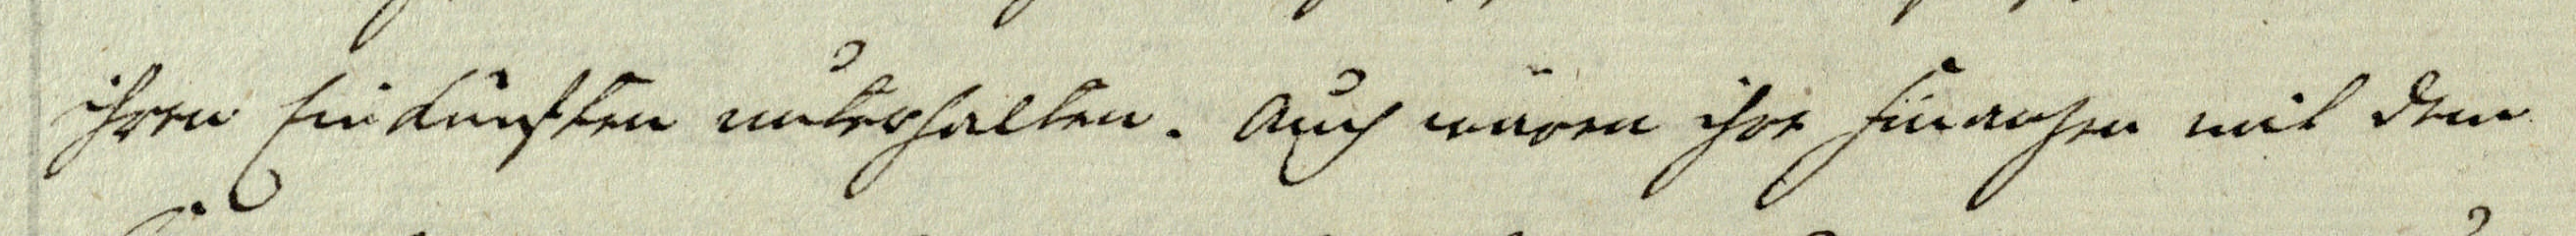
ihren Einkünften unterhalten. Auch wären ihre Finanzen mit dem
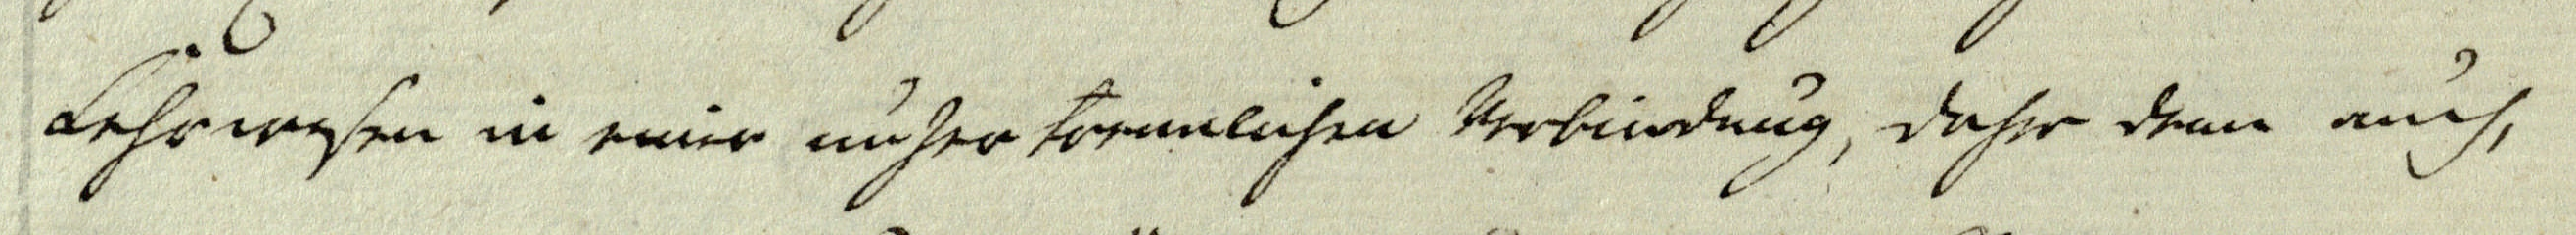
Lehrwesen in einer umzertrennlichen Verbindung, daher denn auch,
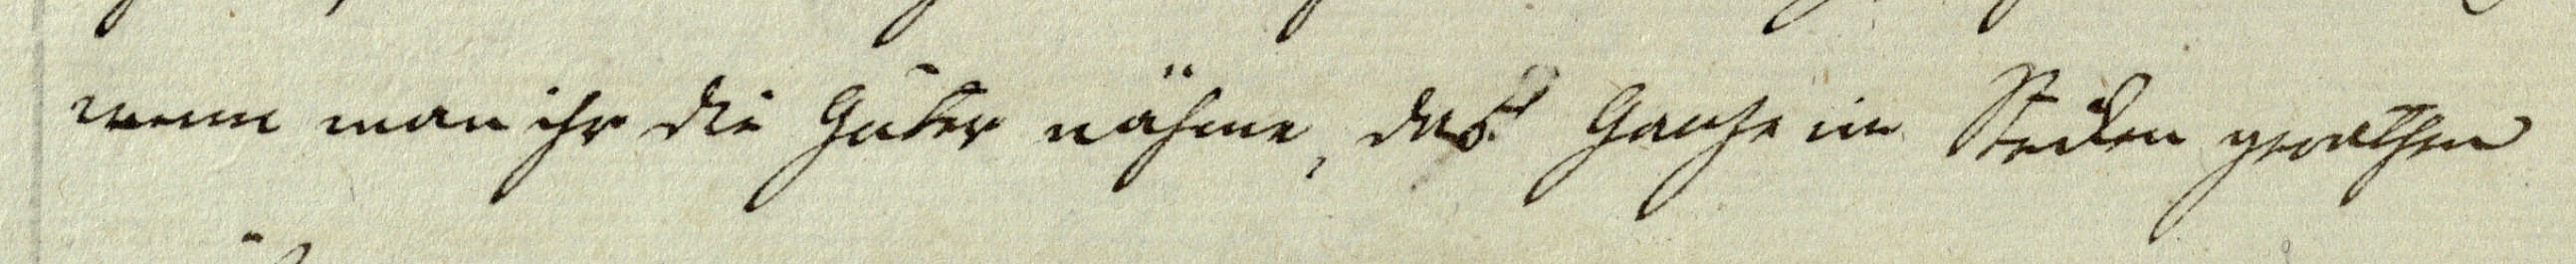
wenn man ihr die Güter nähme, das Ganze in Stecken gerathen
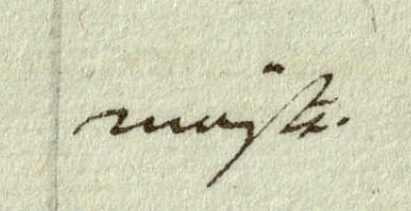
müste.
